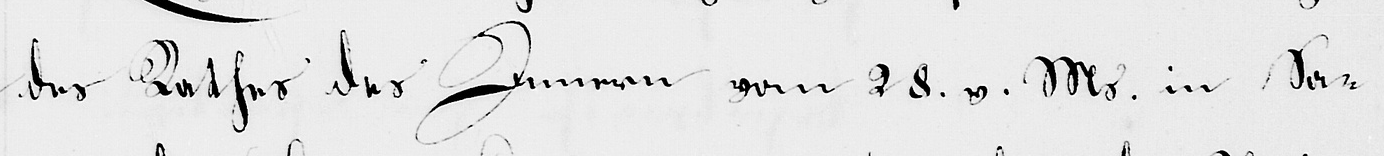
des Rathes des Innern vom 28. v. Ms. in Sa¬
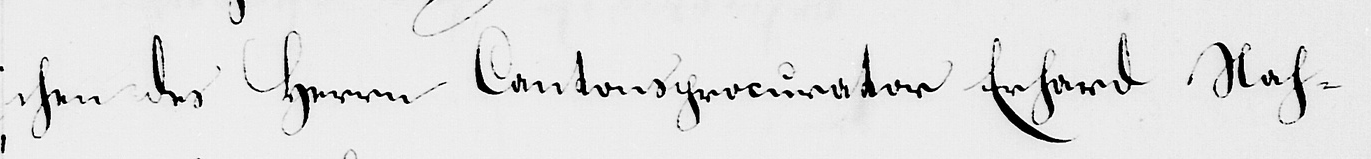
chen des Herrn Cantonsprocurator Erhard Nah¬
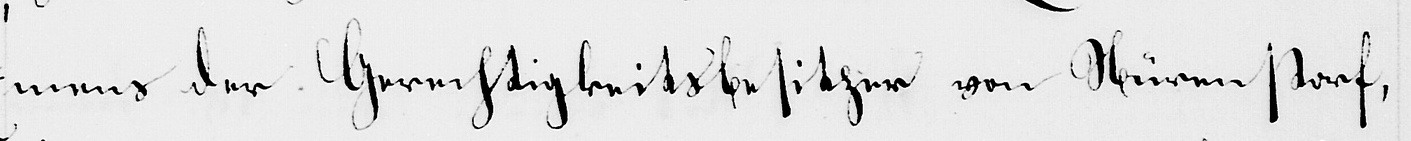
mens der Gerechtigkeitsbesitzer von Nürenstorf,
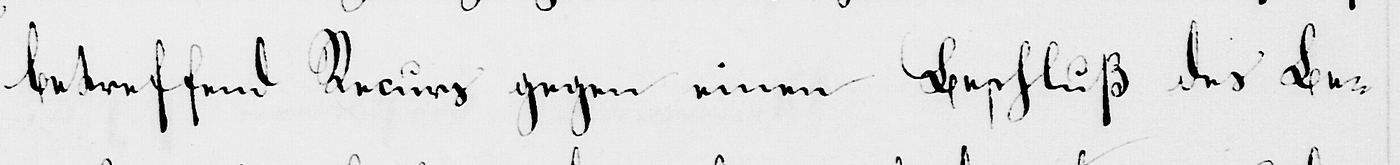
betreffend Recurs gegen einen Beschluß des Be¬
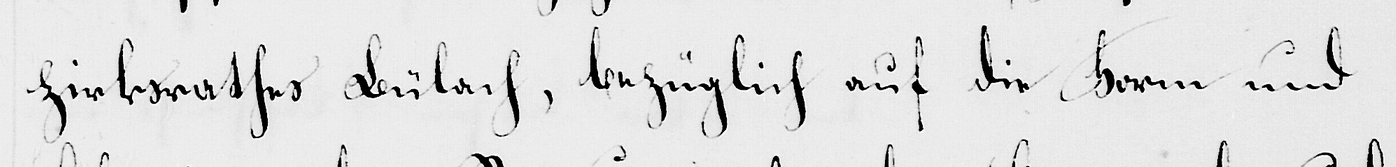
zirksrathes Bülach, bezüglich auf die Form und
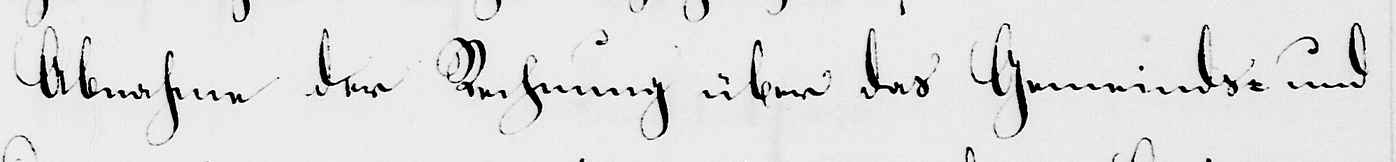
Abnahme der Rechnung über das Gemeinds- und
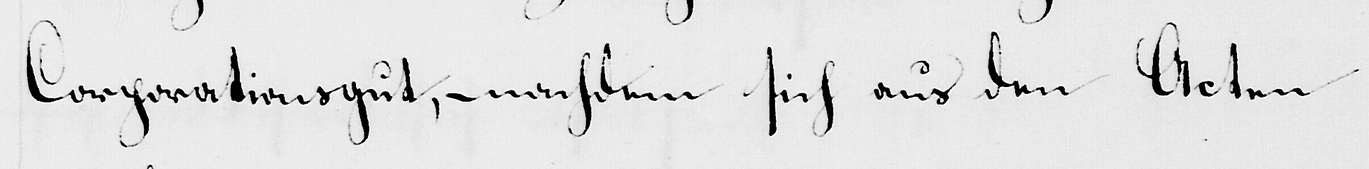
Corporationsgut, – nachdem sich aus den Acten
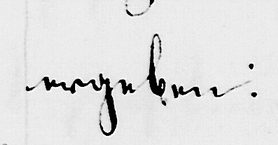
ergeben:
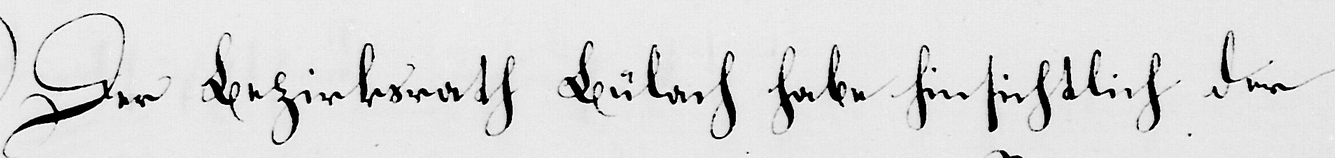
Der Bezirksrath Bülach habe hinsichtlich der
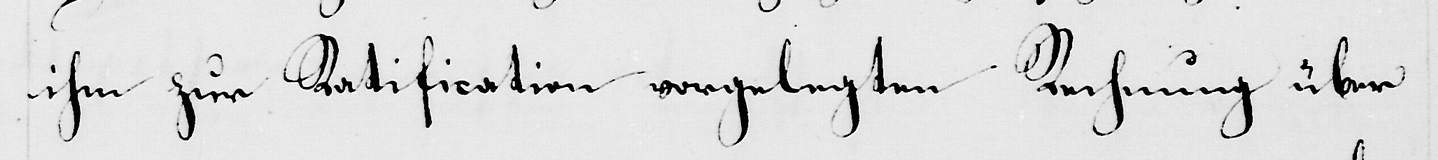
ihm zur Ratification vorgelegten Rechnung über
